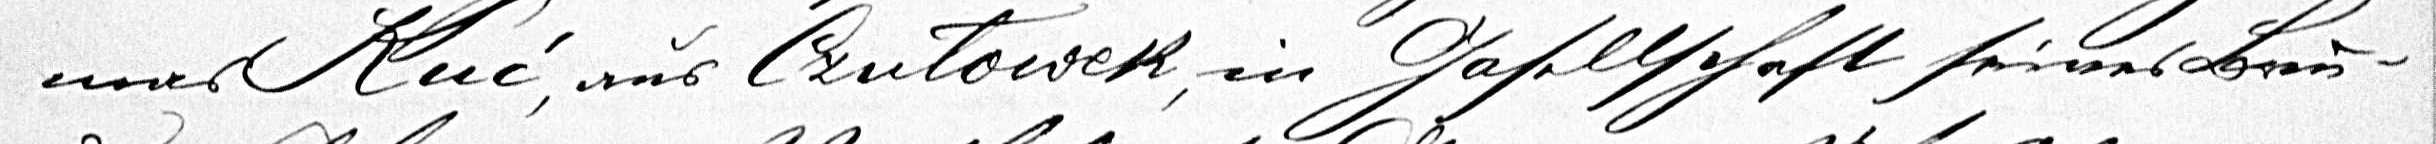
mas Kuć aus Czułowek in Gesellschaft seines Bru¬
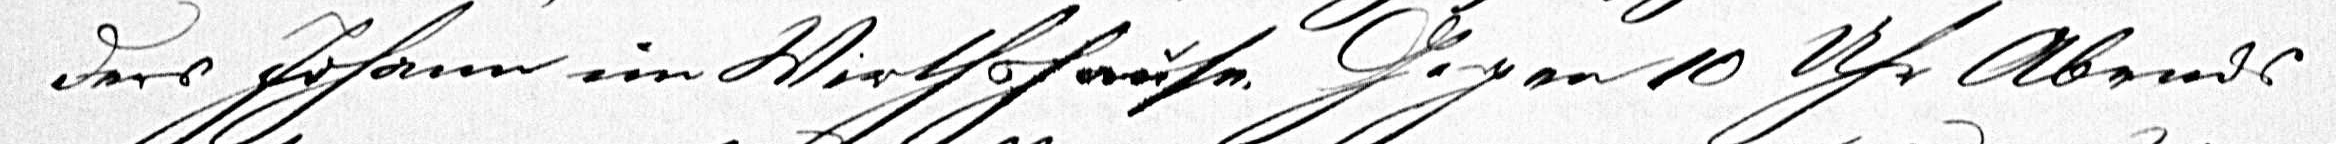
ders Johann in Wirthshause. Gegen 10 Uhr Abends
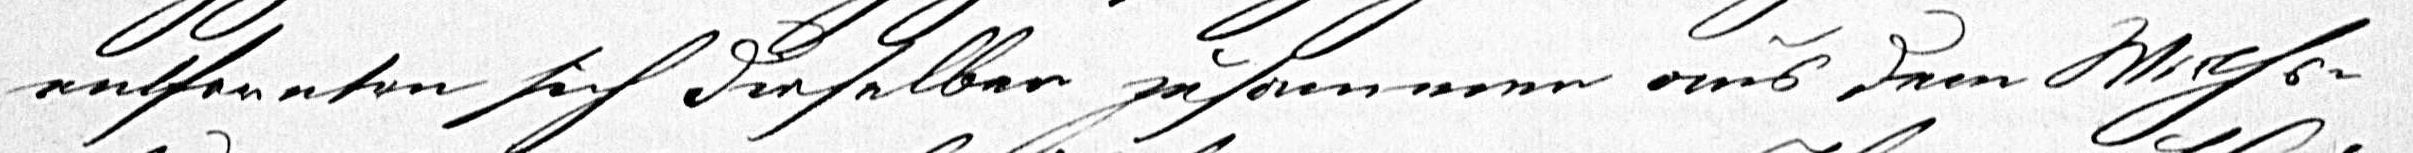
entfernten sich dieselber zusammen aus dem Wirths¬
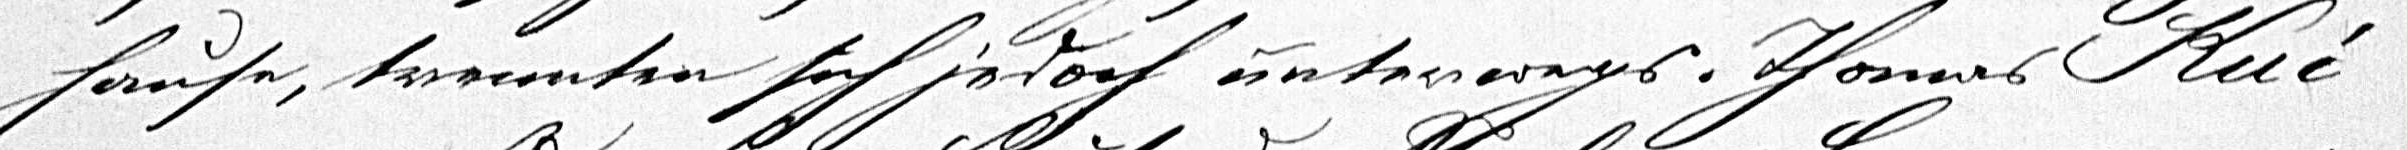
hause, trennten sich jedoch unterwegs. Thomas Kuć
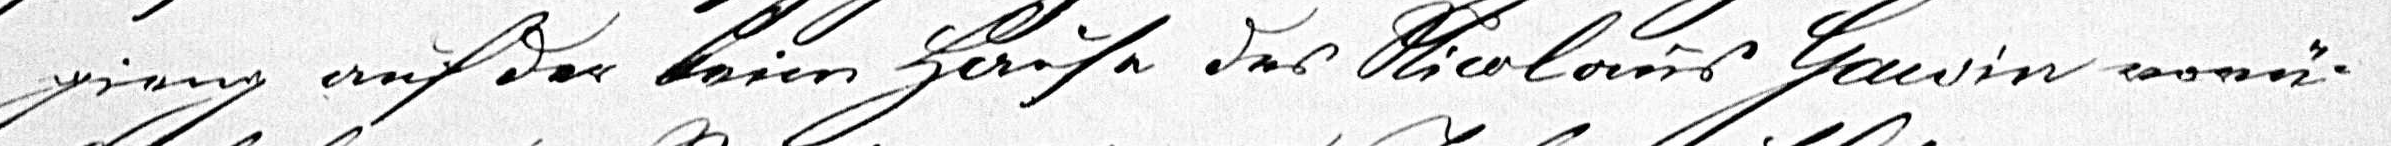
gieng auf der beim Hause des Nicolaus Gawin vorü¬
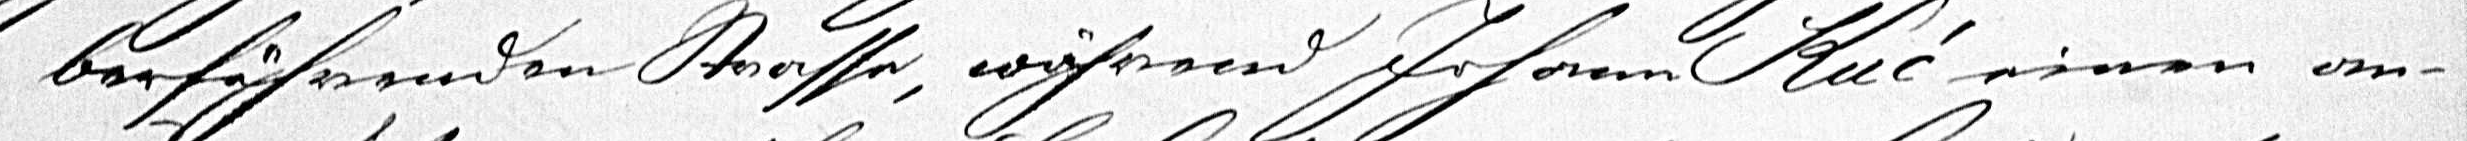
berführenden Strasse, während Johann Kuć einen an¬
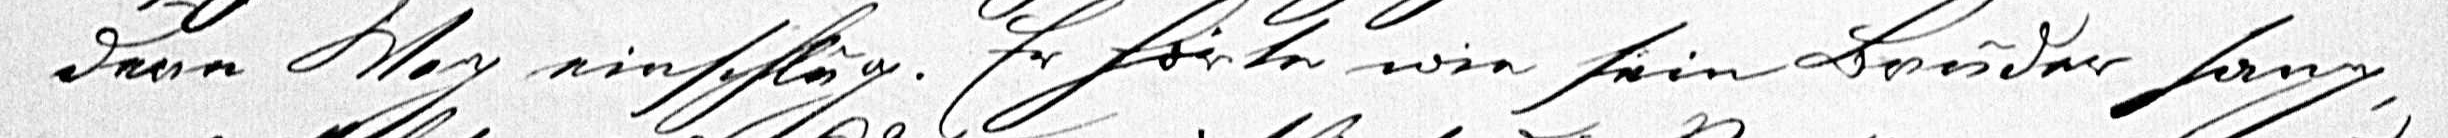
deren Weg einschlug. Er hörte wie sein Bruder sang
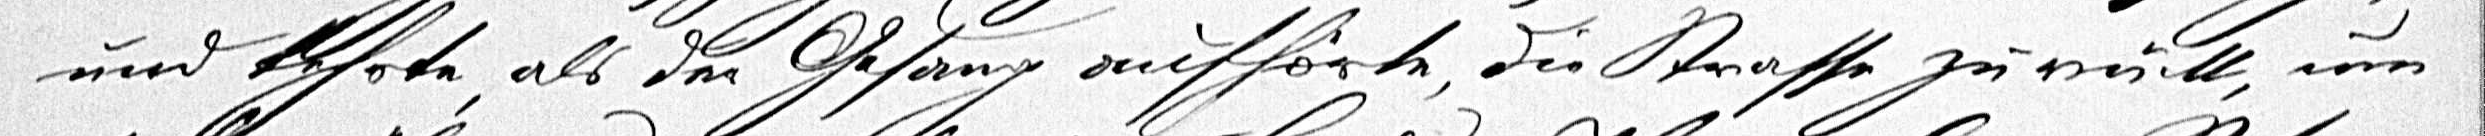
und kehrte, als den Gesang aufhörte, die Strasse zurück, um
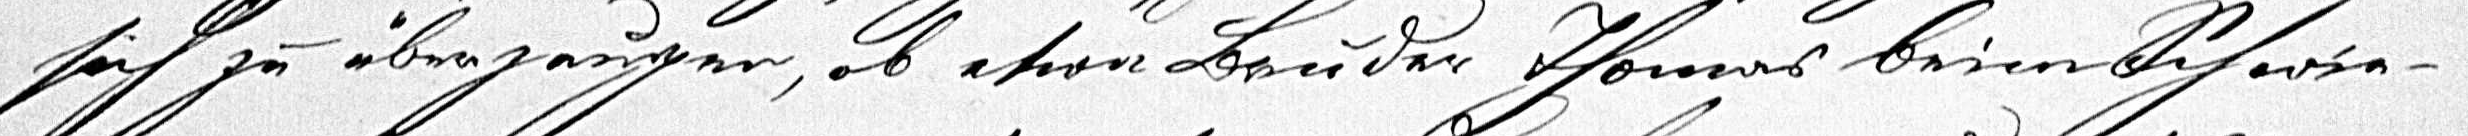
sich zu überzeugen, ob etwa Bruder Thomas beim Schwie¬
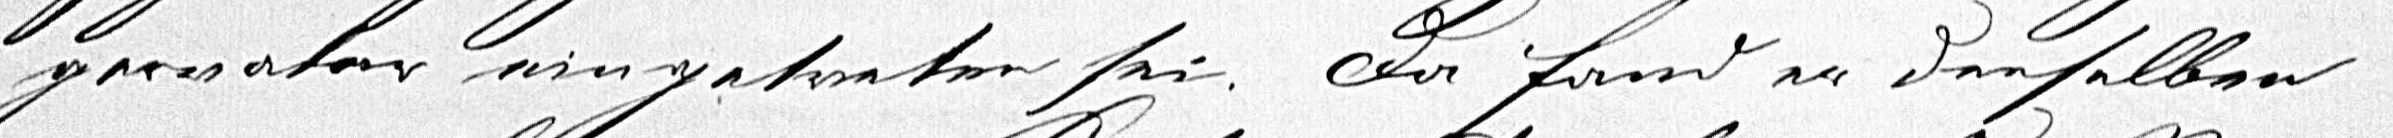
gervater eingetreten sei. Da fand er denselben
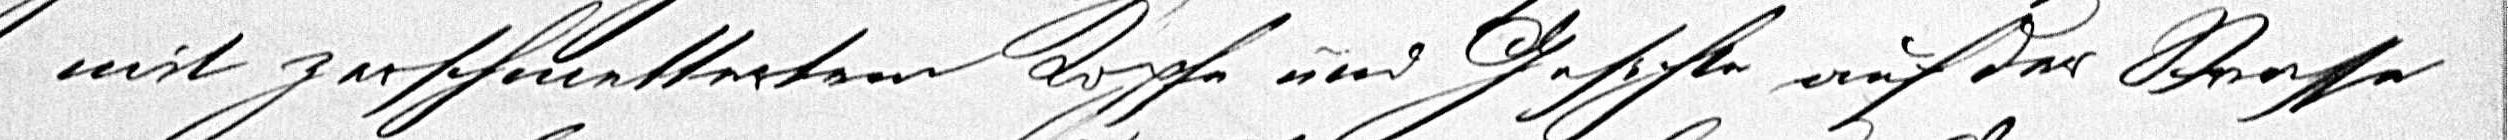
mit zerschmettertem Kopfe und Gesichte auf der Strasse
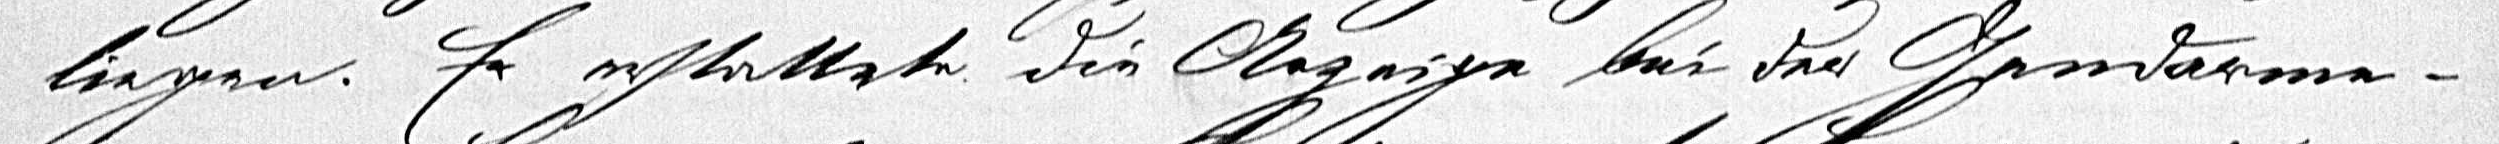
liegen. Er erstattet die Anzeige bei der Gendarme¬
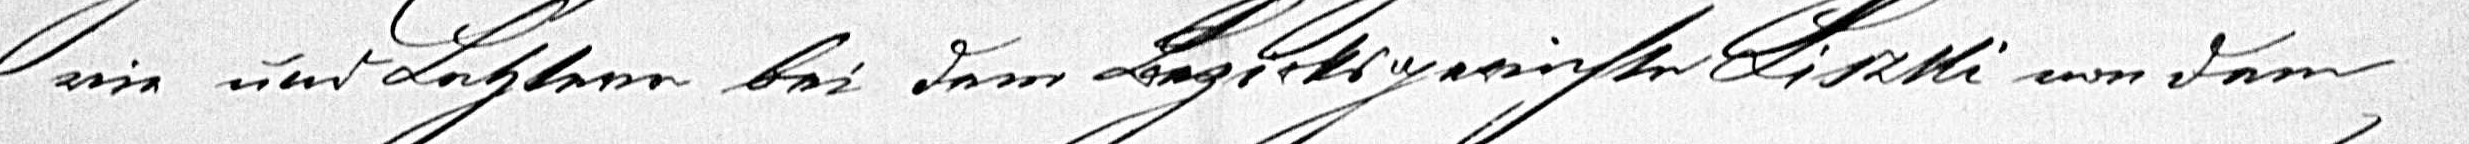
rie und Letztere bei dem Bezirksgerichte Liszki von dem
